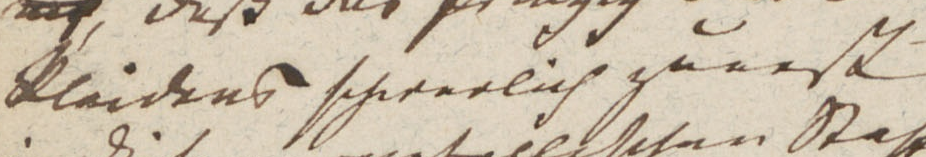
kleidens schwerlich zuerst
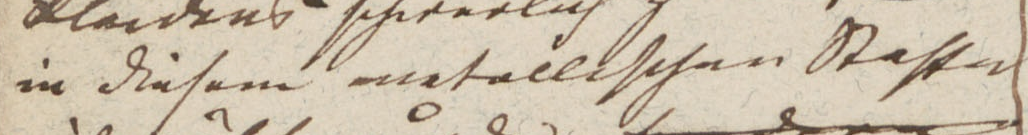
in diesem metallischen Stoffe
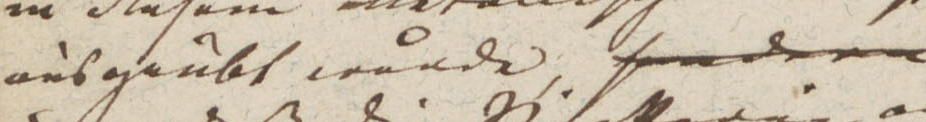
ausgeübt wurde, sondern
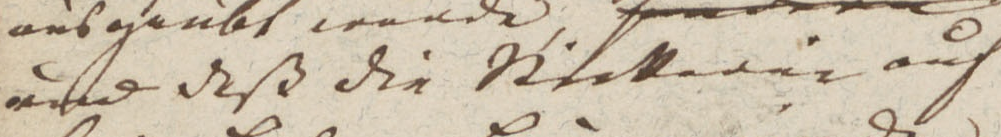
und dass die Stickerei auf
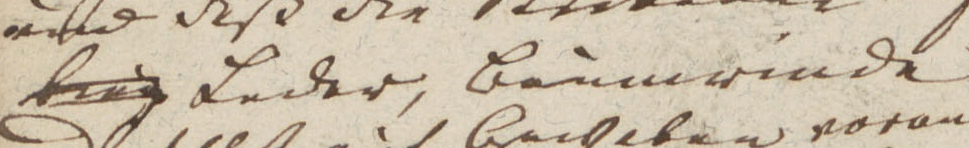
bug Leder, Baumrinde
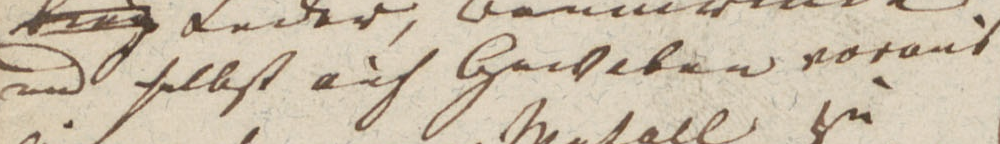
und selbst auf Geweben voraus
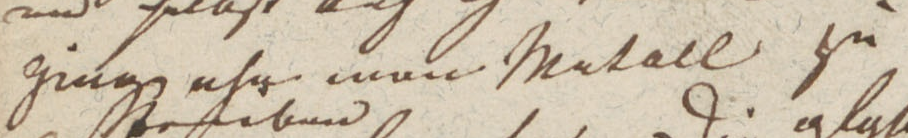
ging ehe man Metall zu
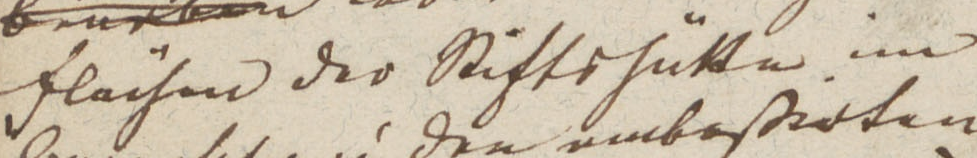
Flächen der Stiftshütte im
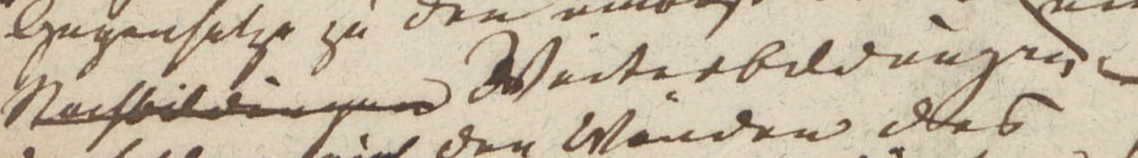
Nachbildungen Weiterbildungen
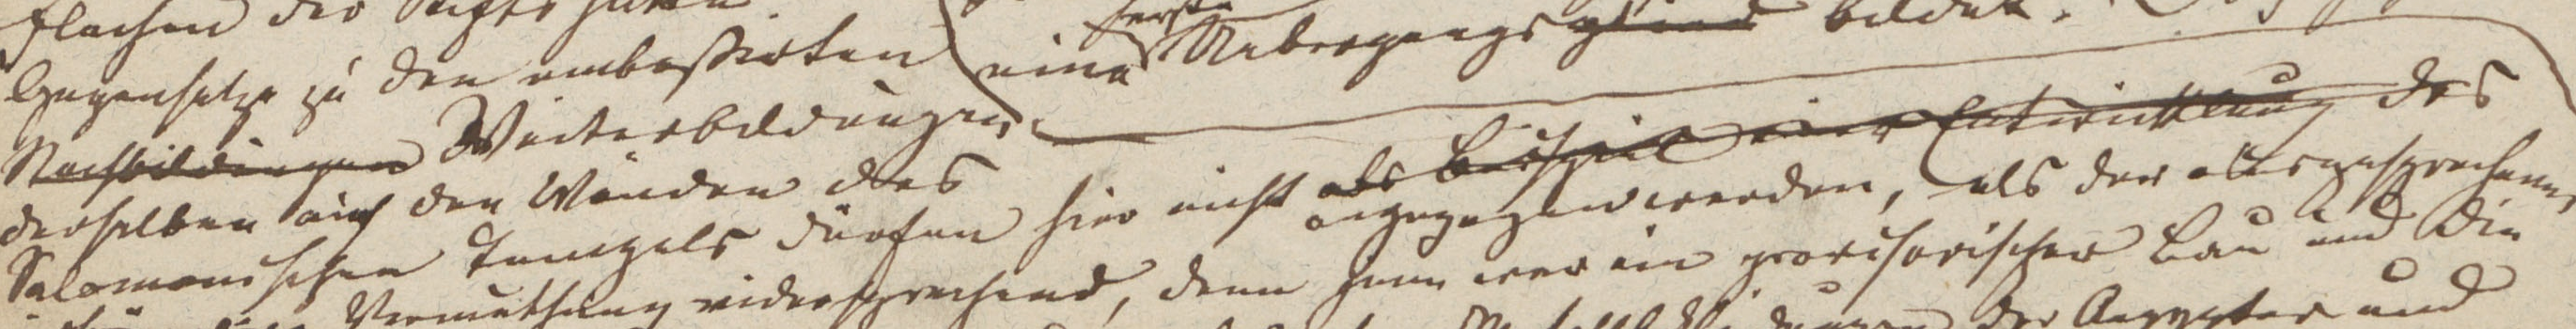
Salomonischen Tempels dürfen hier nicht als Beispiel einer Entwicklung des
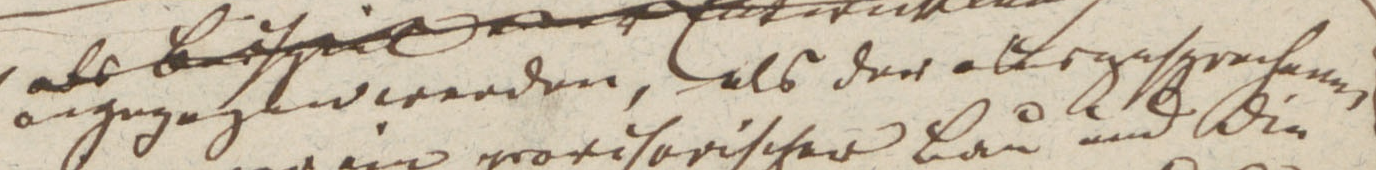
angezogen werden, als der ausgesprochenen
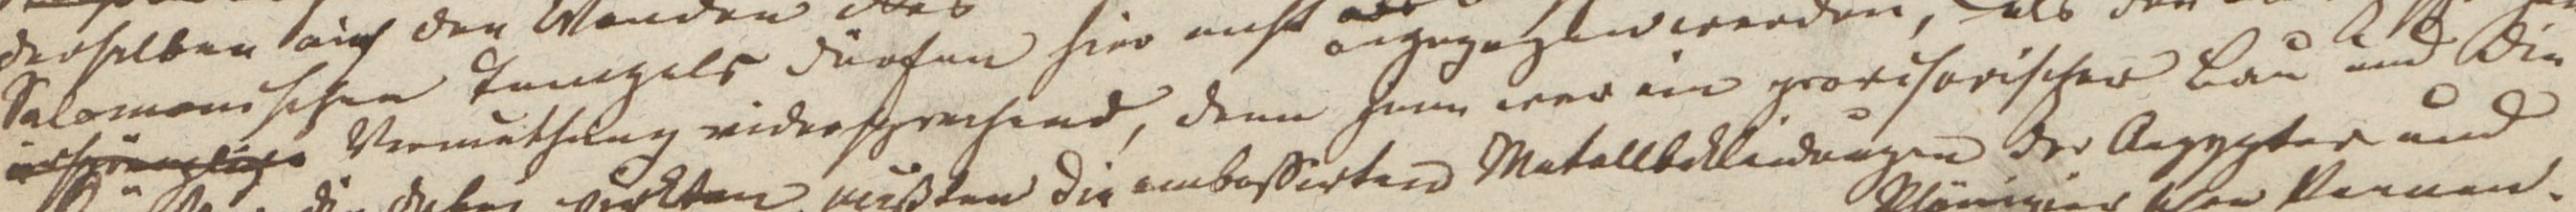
ursprüngliche Vermuthung widersprechend, denn jene war ein provisorischer Bau und die
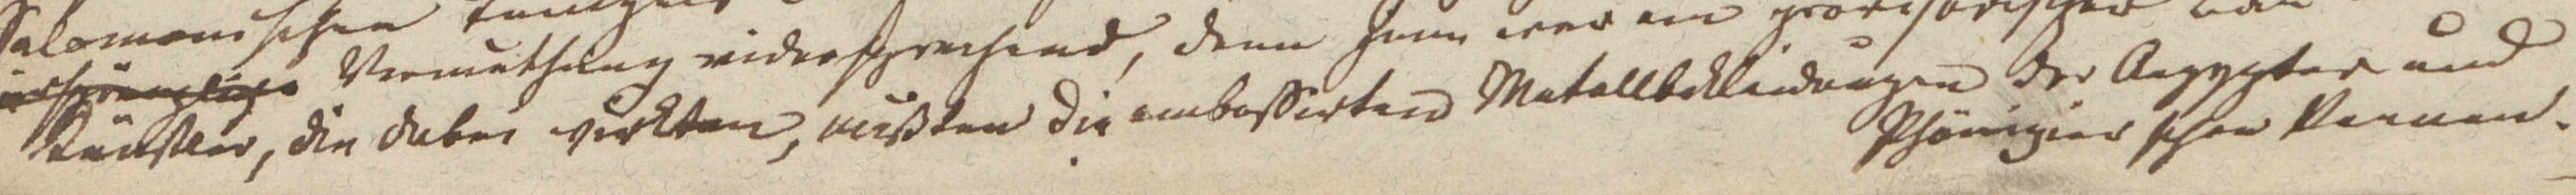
Künstler, die dabei wirkten, mussten die embossirten Metallbekleidungen der Aegypter und
